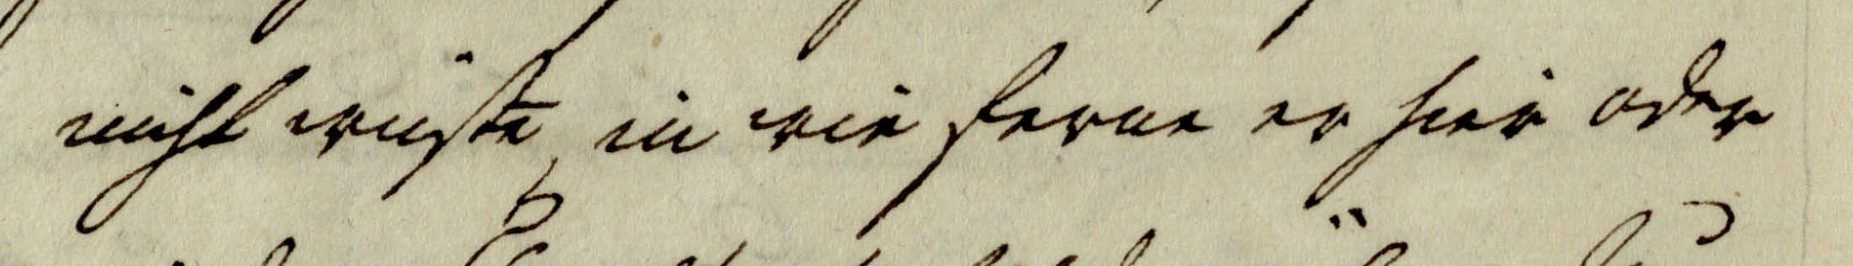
nicht wüßte, in wie ferne er hier oder
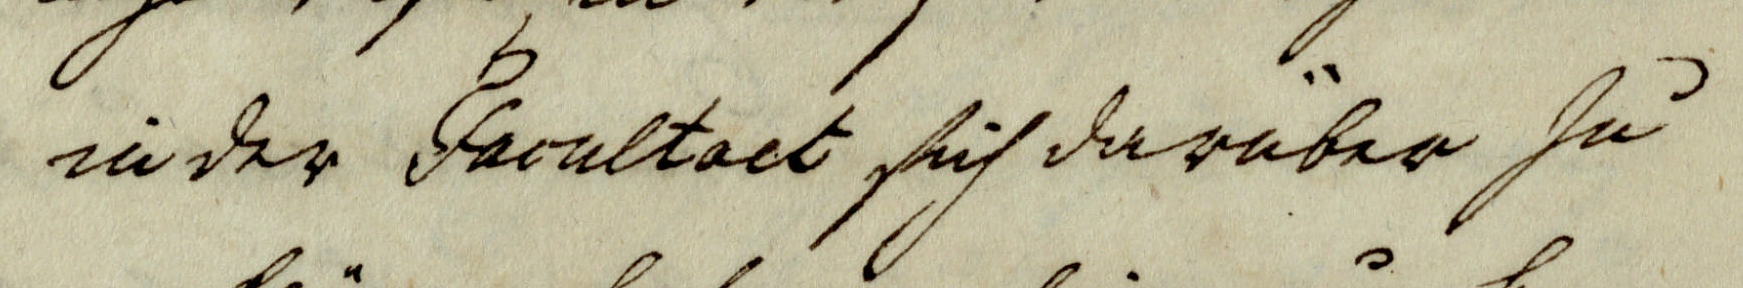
in der Facultaet sich darüber zu
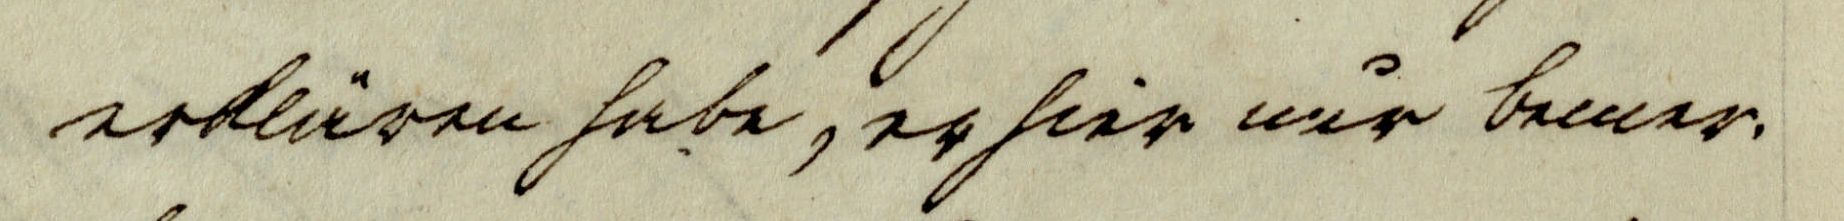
erklären habe, er hier nur bemer¬
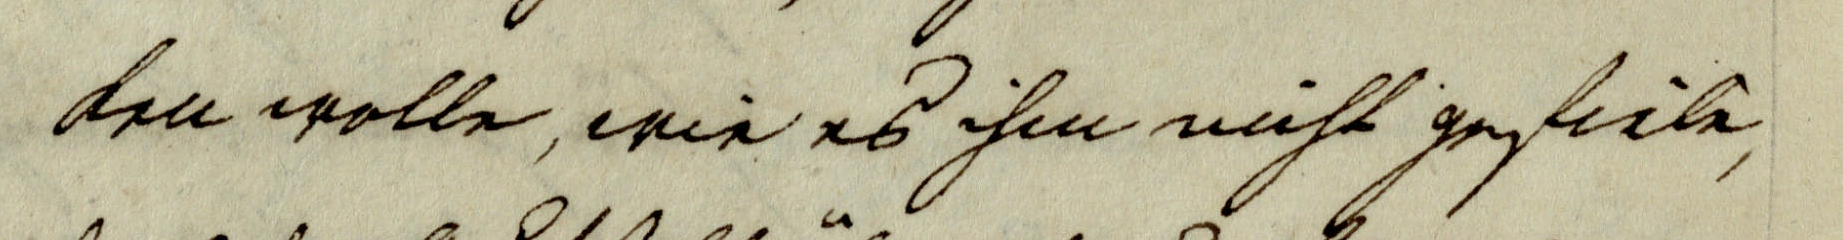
ken wolle, wie es ihm nicht gefiele,
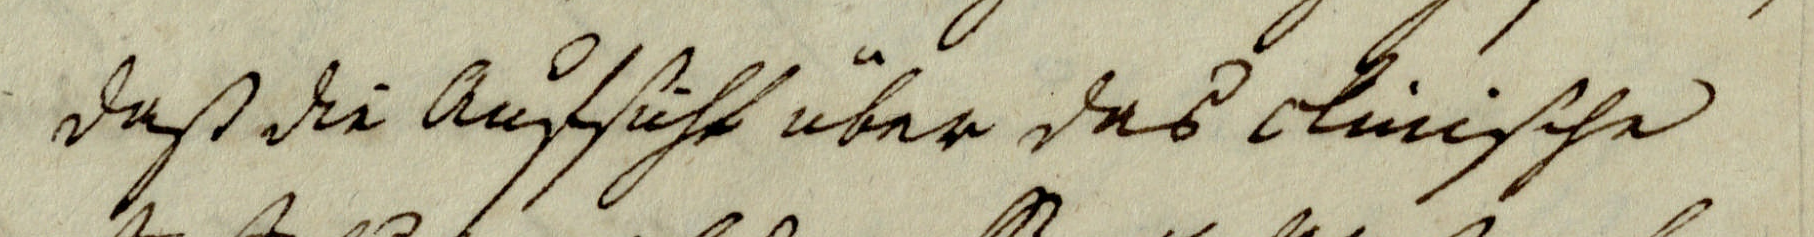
daß die Aufsicht über das clinische
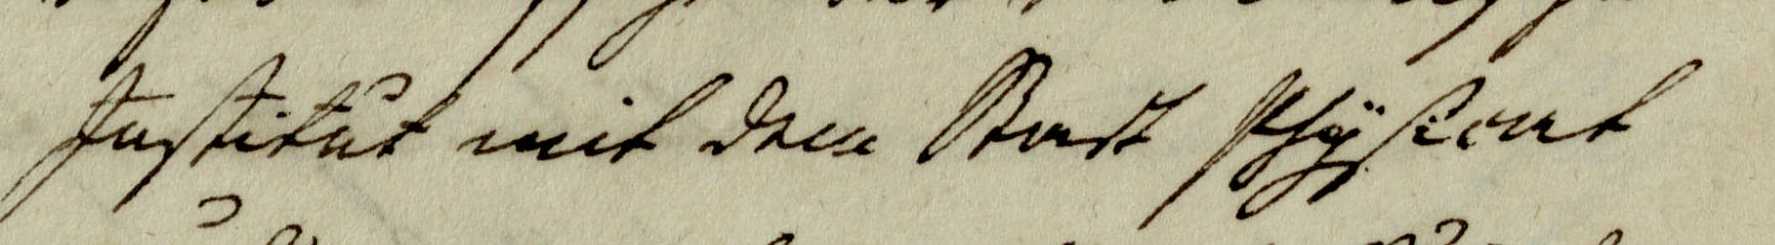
Institut mit dem Stadt Phÿsicat
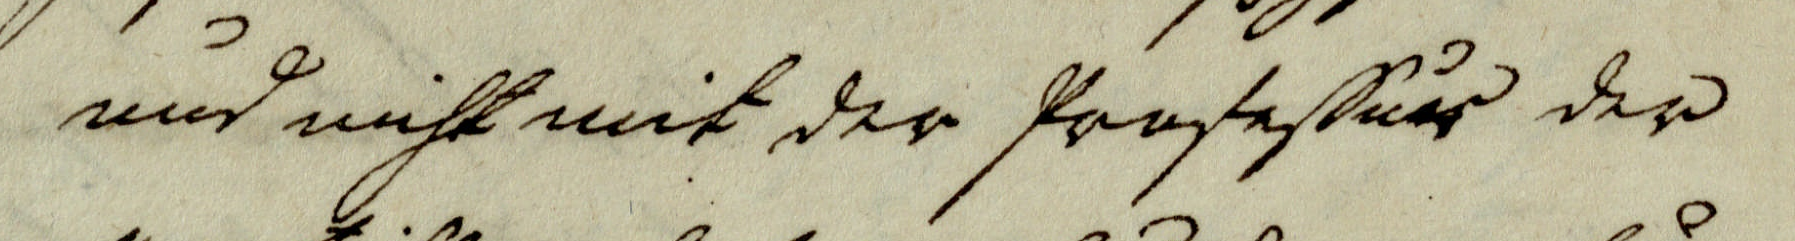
und nicht mit der Professur der
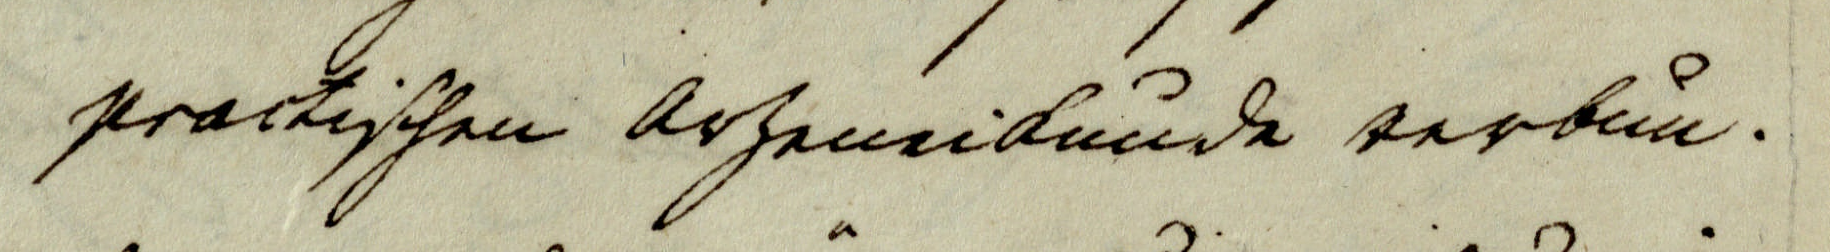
practischen Arzeneikunde verbun¬
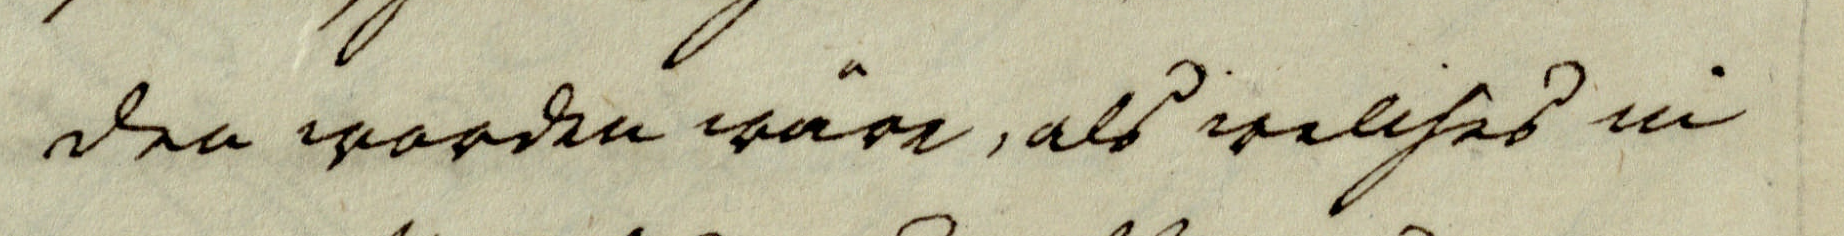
den worden wäre, als welches in
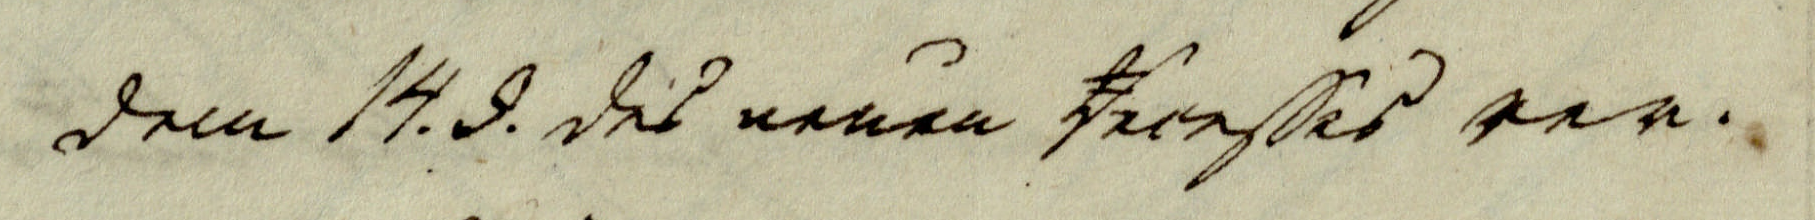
dem 14. §. des neuen Recesses ver¬
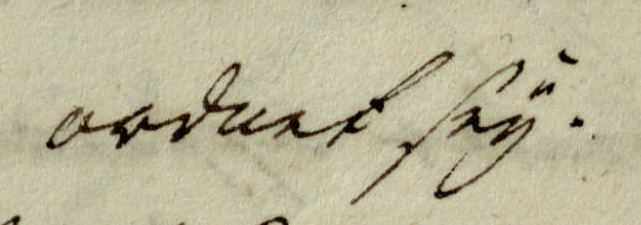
ordnet seÿ.
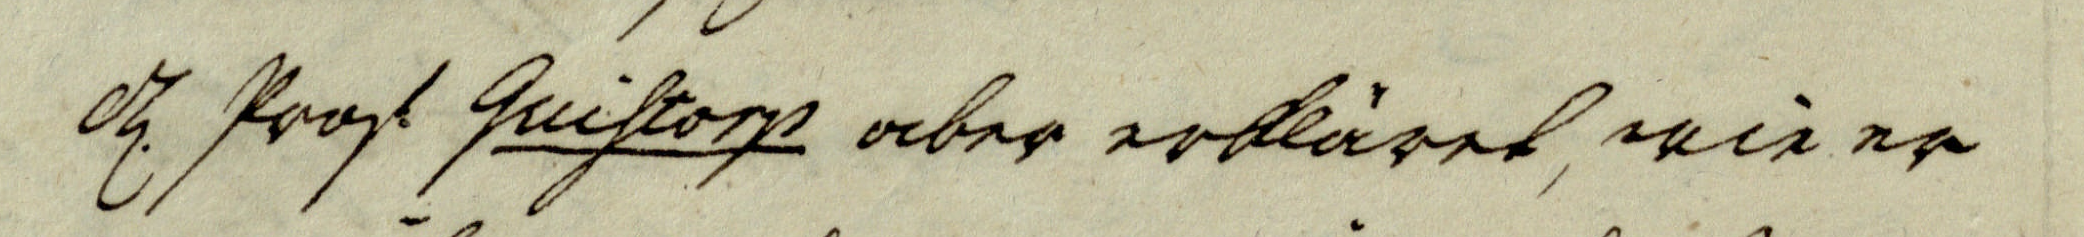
dh. Prof. Quistorp aber erkläret, wie er
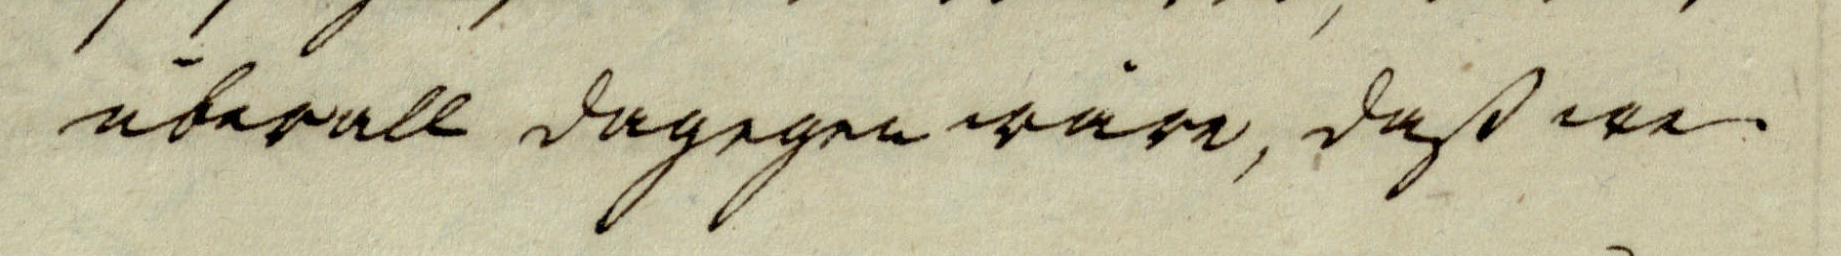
überall dagegen wäre, daß we¬
